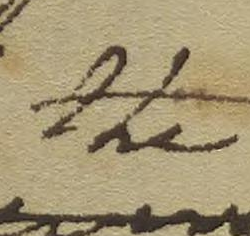the
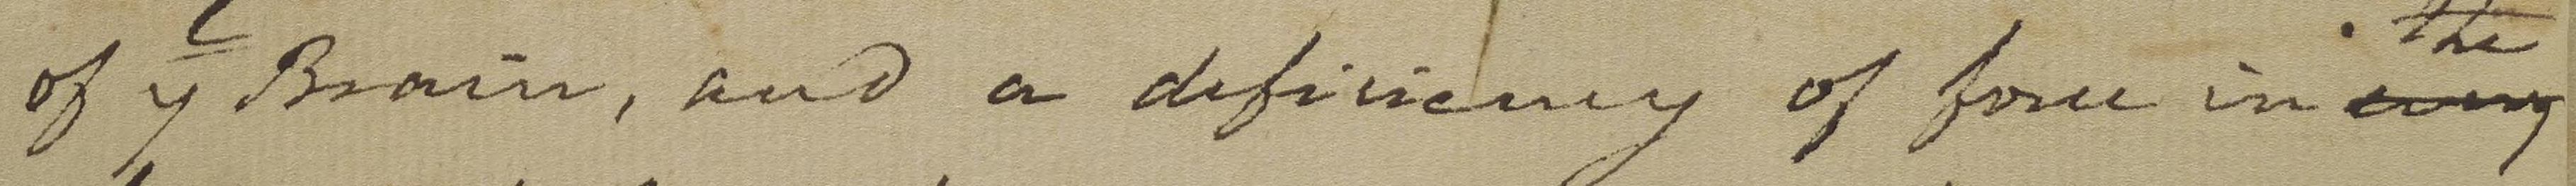of y^e Brain, and a deficiency of force in [every]
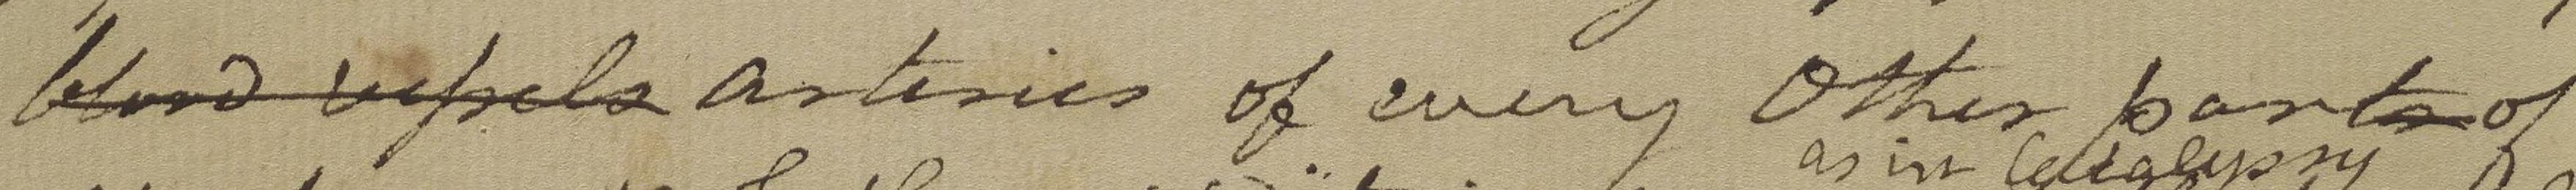[blood vessels] arteries of every other part of
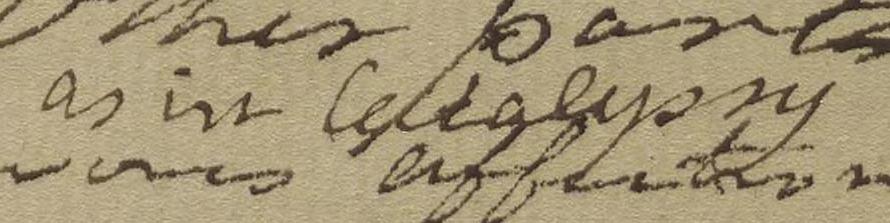as in catalepsy
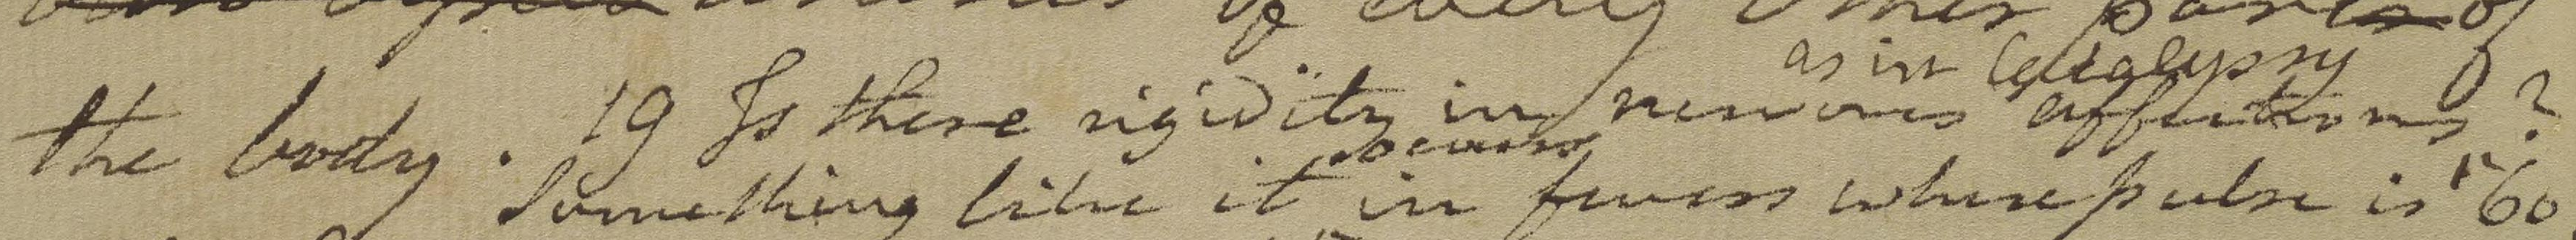the body. 19. Is there rigidity in nervous affections ^ ?
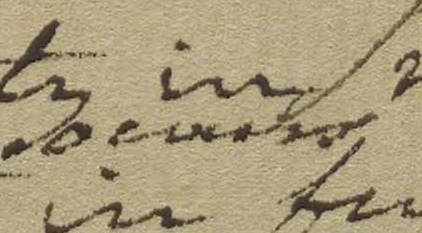occurs
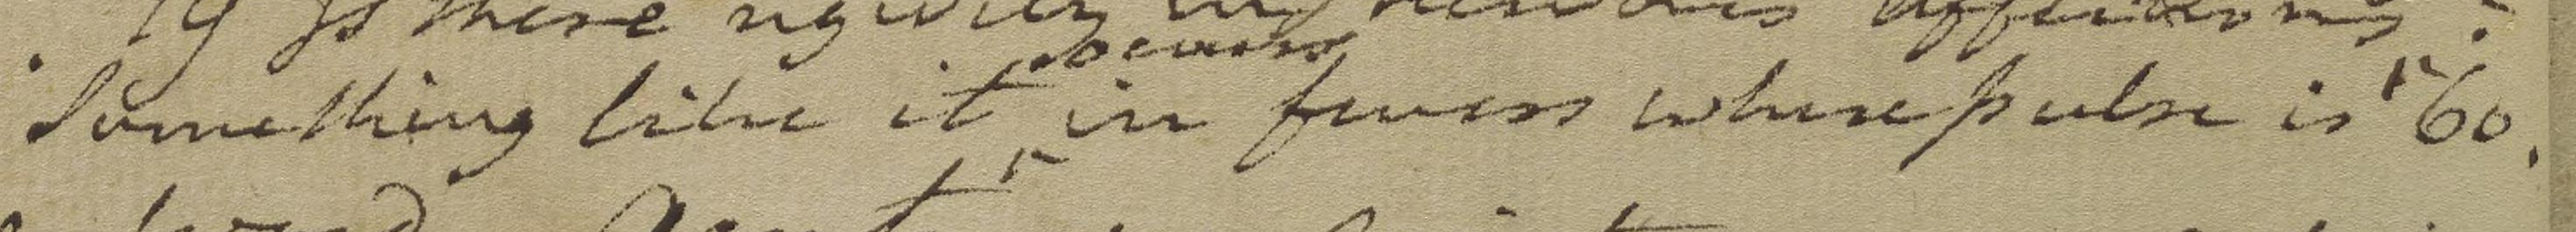something like it ^ in fevers where pulse is 60
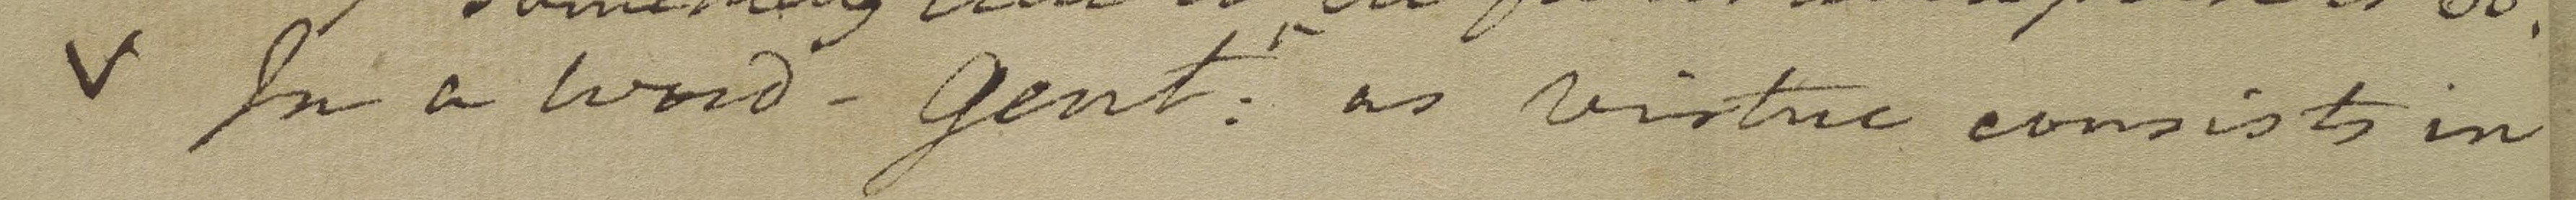V In a word, gent^n: as virtue consists in
